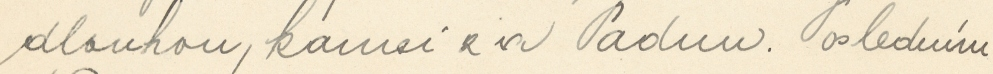dlouhou, kamsi za Padovu. Posledním
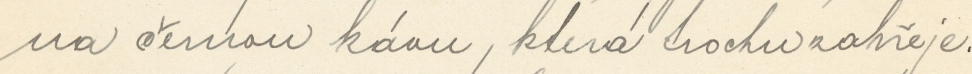na černou kávu, která trochu zahřeje.
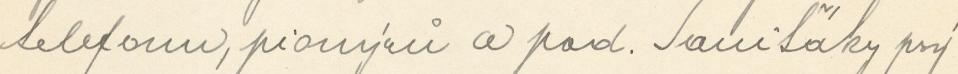telefonu, pionýrů a pod. Saniťáky prý
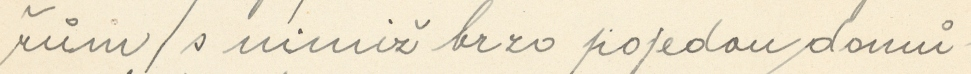řům, s nimiž brzo pojedou domů -
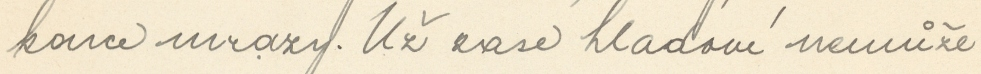konce mrazy. Už zase hladoví nemůže-
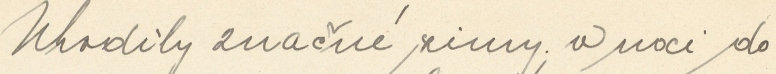Uhodily značné zimy v noci do-
